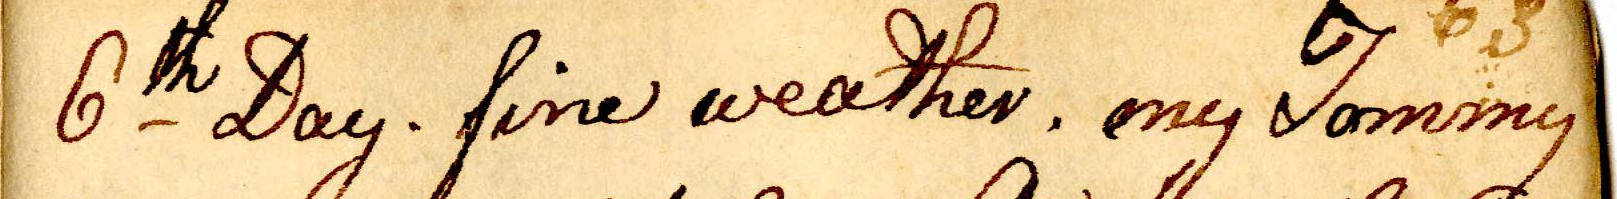6^th Day. fine weather, my Tommy
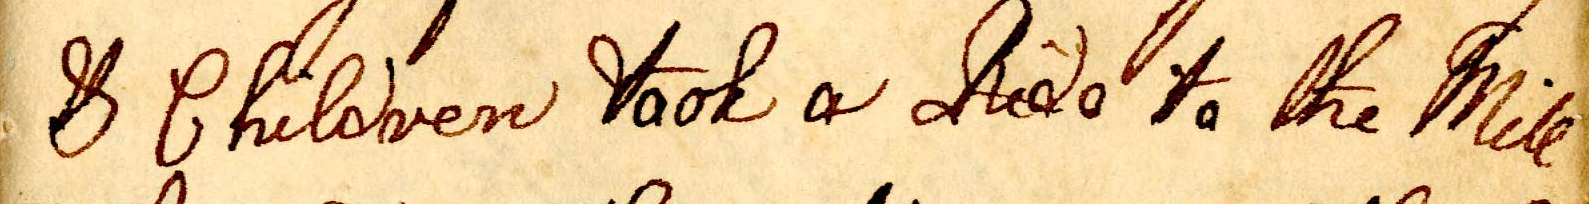& Children took a Ride to the Mill
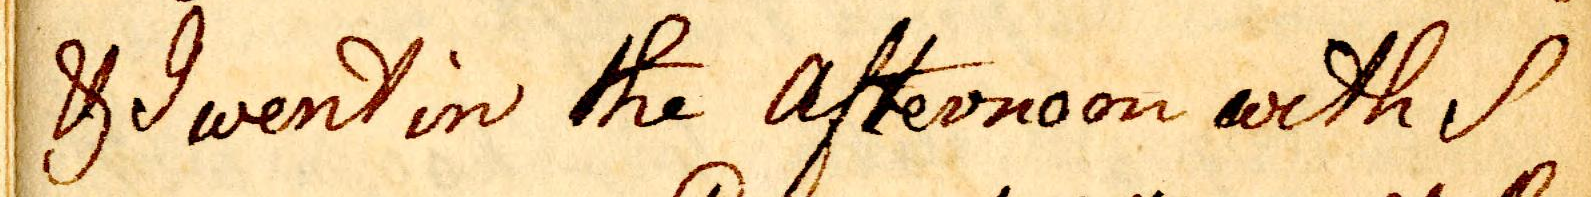& I went in the Afternoon with S
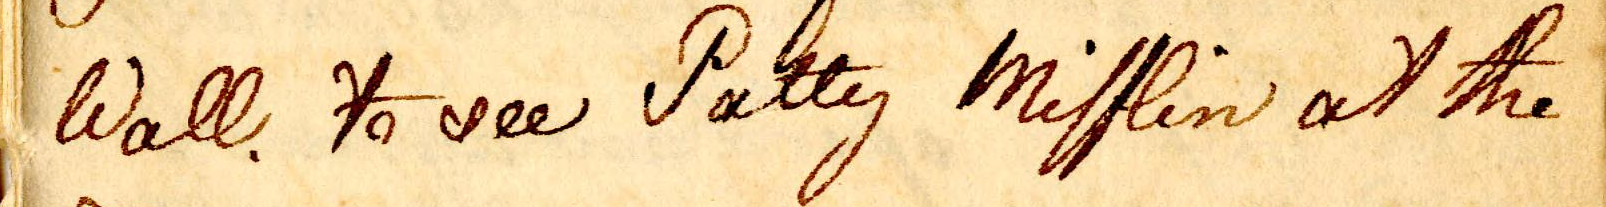Wall. to see Patty Mifflin at the
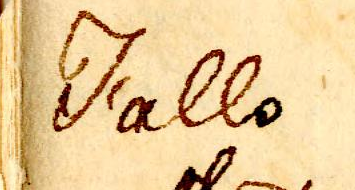Falls
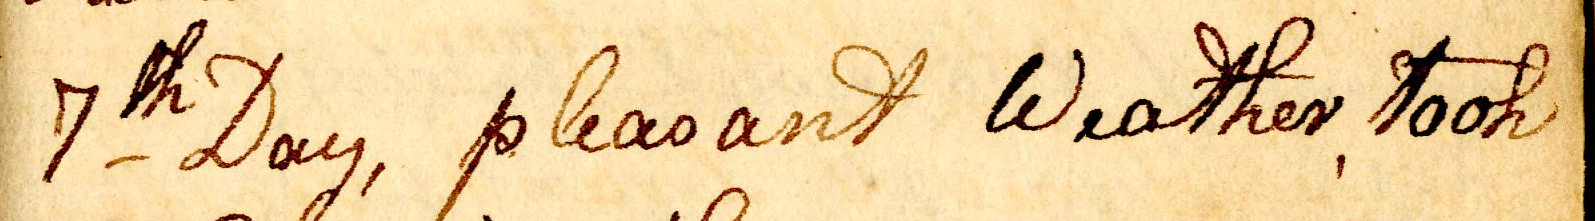7^th Day, pleasant Weather, took
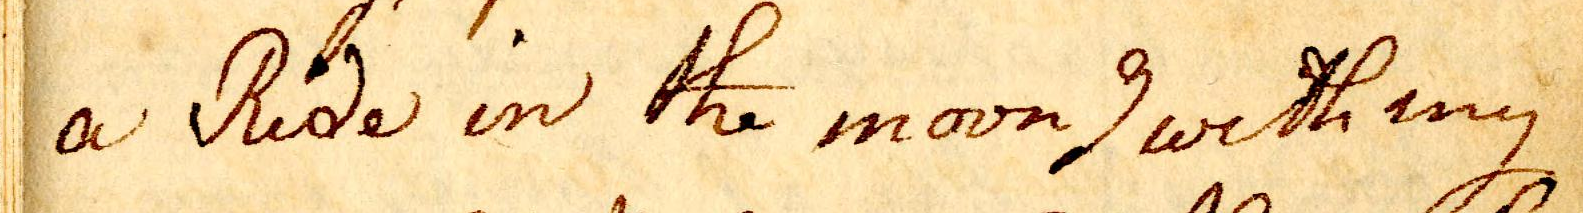a Ride in the morn^g with my
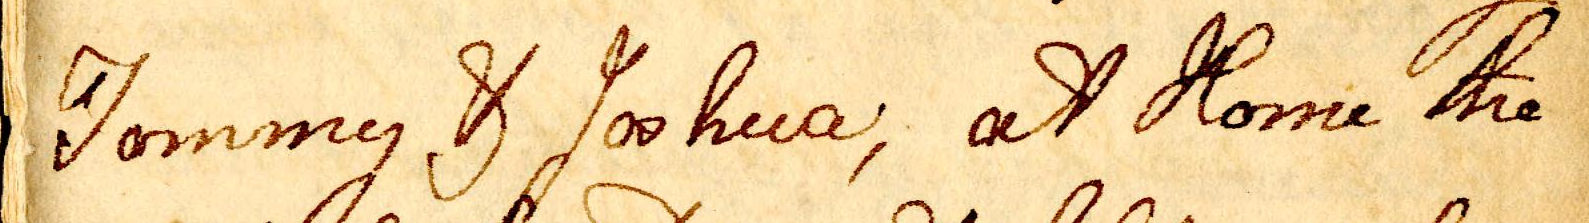Tommy & Joshua, at Home the
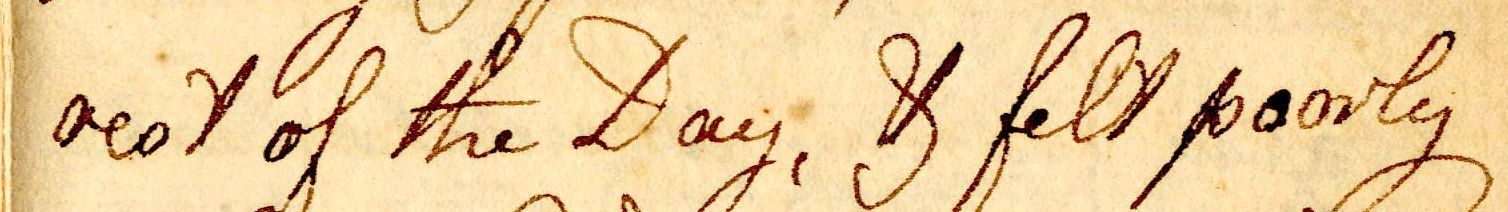rest of the Day, & felt poorly
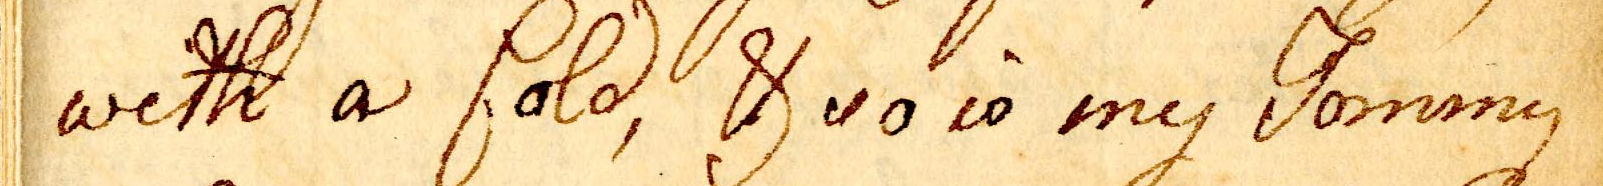with a Cold, & so is my Tommy
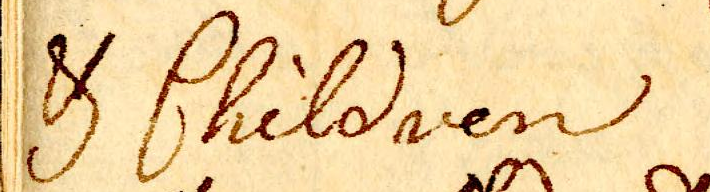& Children
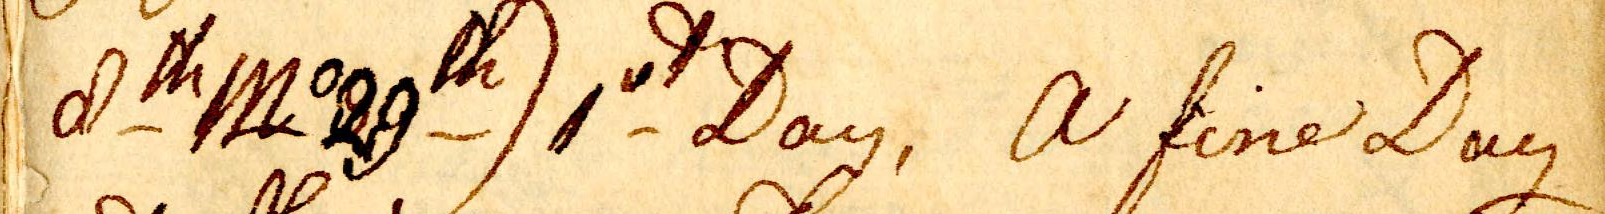8^th M^o 29^th) 1^st Day, A fine Day
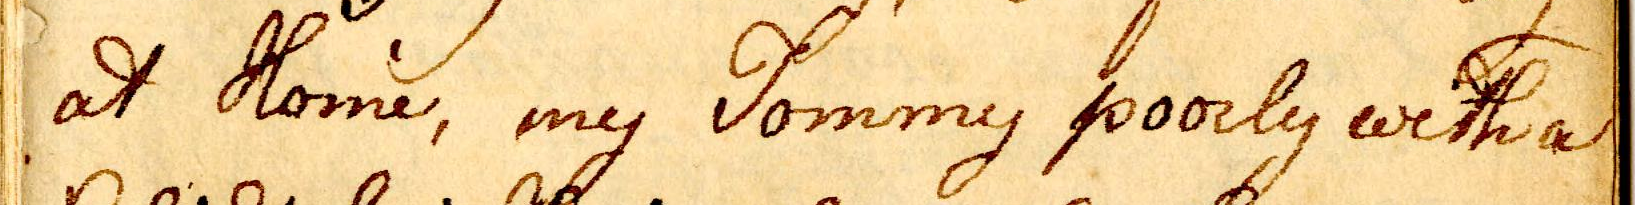at Home, my Tommy poorly with a
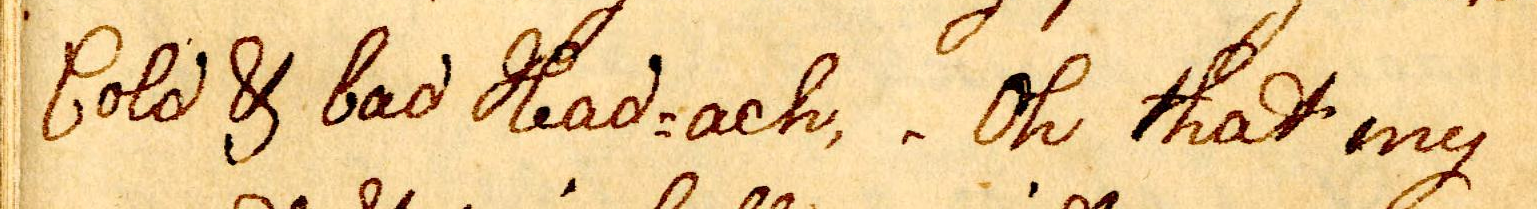Cold & bad Head-ach, Oh that my
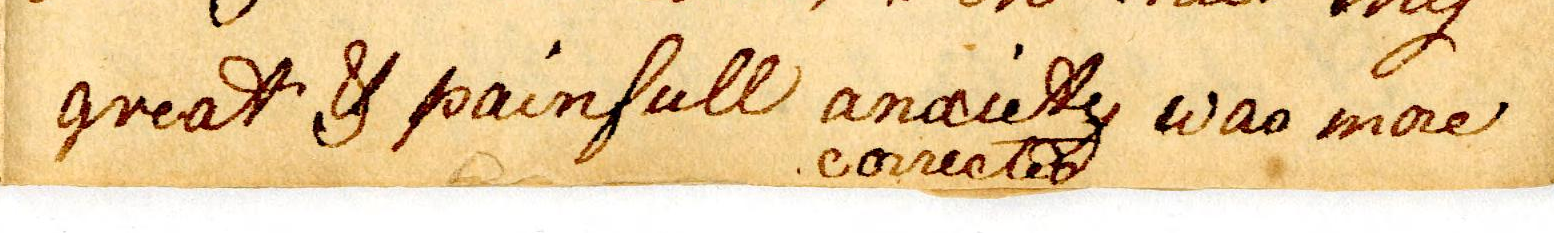great & painfull anxiety was more
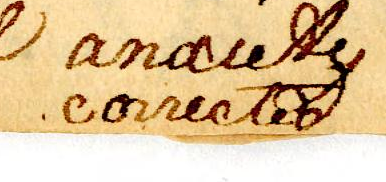corrected
